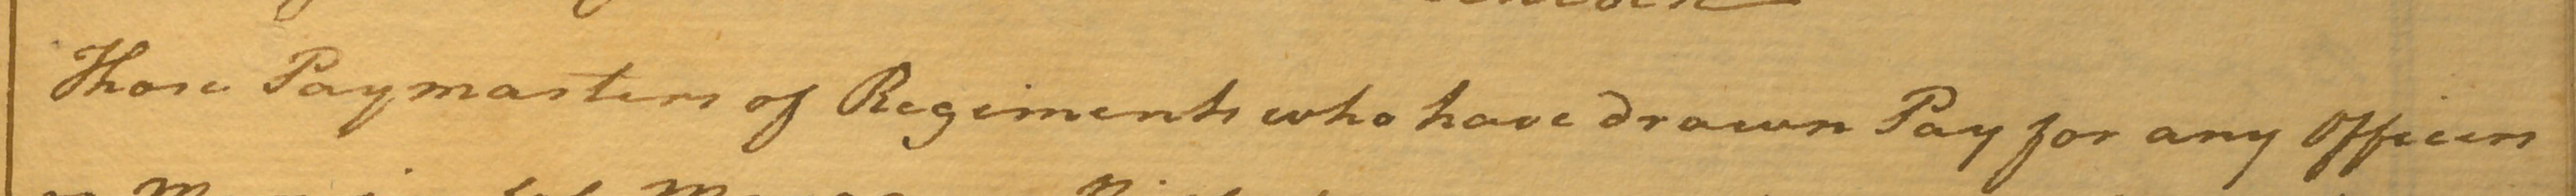Those Paymasters of Regiments who have drawn Pay for any Officers
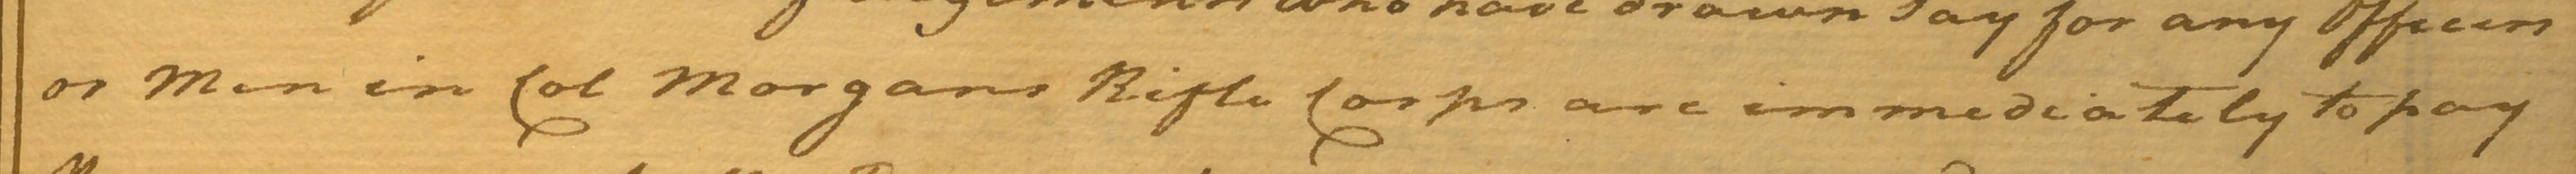or Men in Col Morgans Rifle Corps are immediately to pay
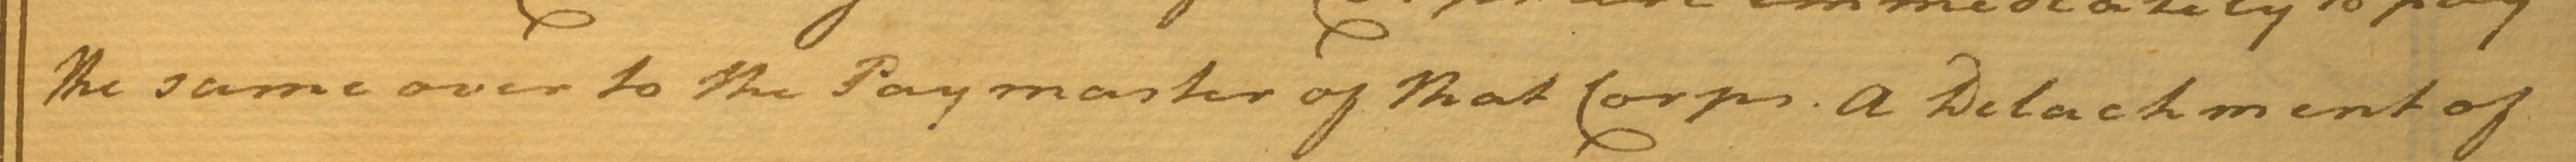the same over to the Paymaster of that Corps. A Detachment of
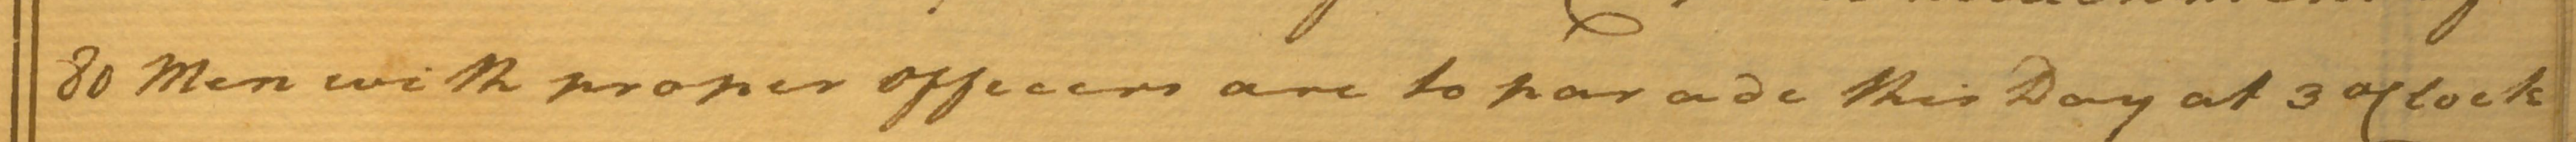80 Men with proper Officers are to parade this Day at 3 ^oClock
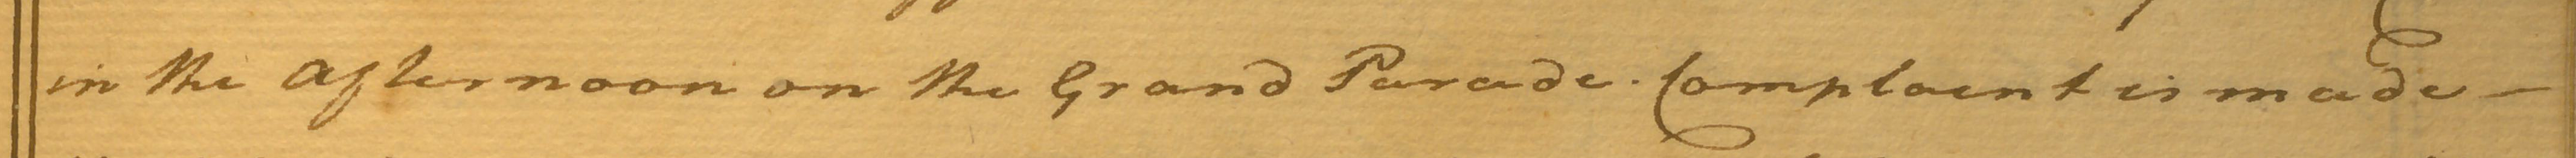in the Afternoon on the Grand Parade. Complaint is made
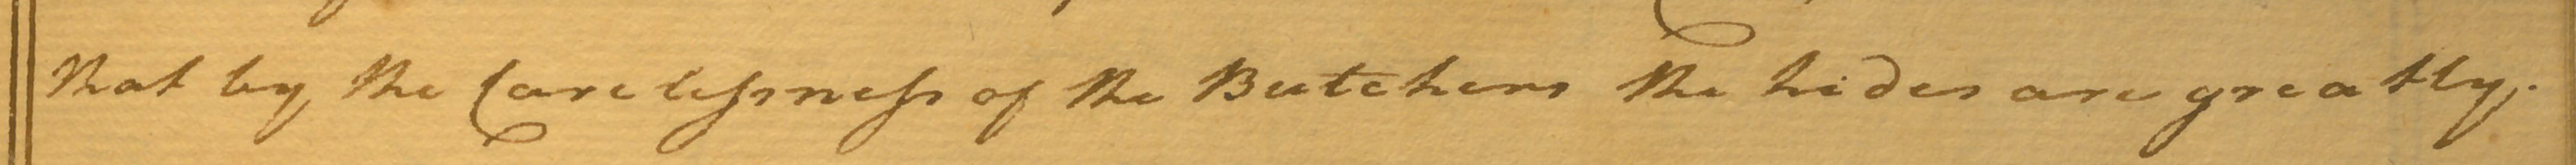that by the Carelessness of the Butchers the hides are greatly
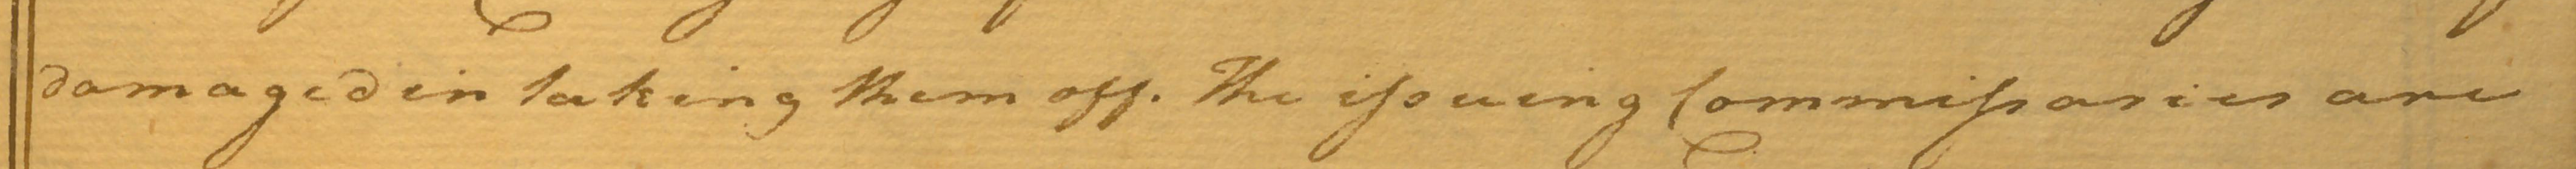damaged in taking them off. The issuing Commissaries are
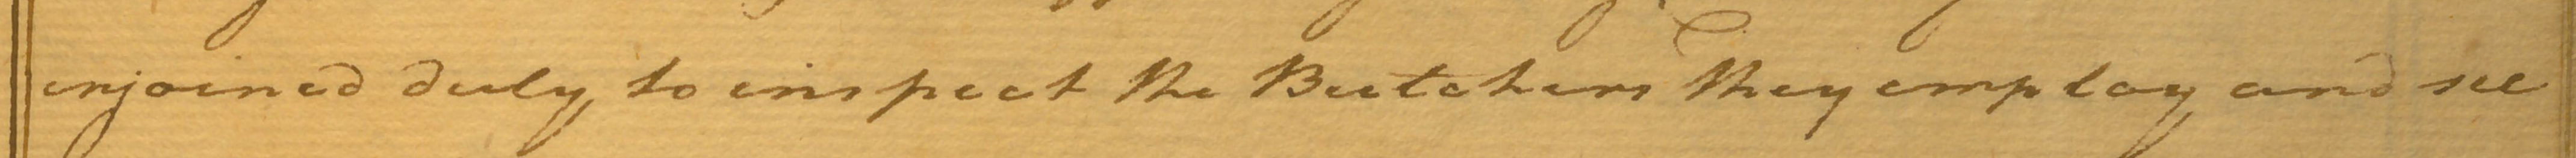enjoined duly to inspect the Butchers they employ and see
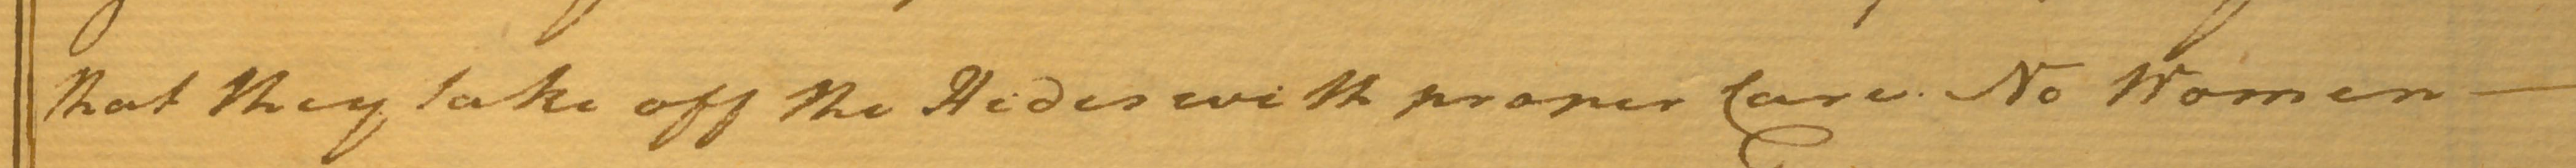that they take off the Hides with proper Care. No Women
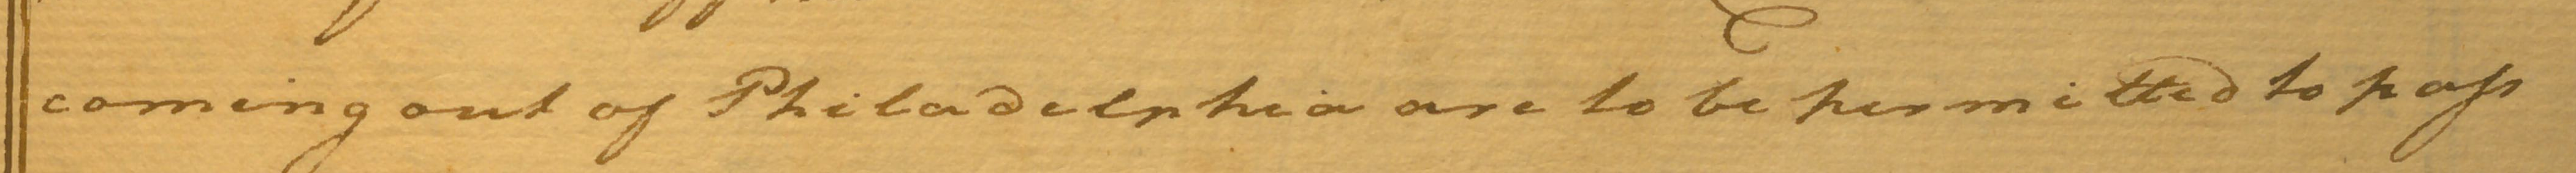coming out of Philadelphia are to be permitted to pass
